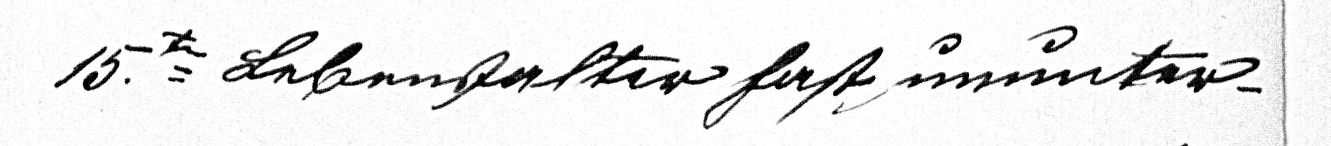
15.ten Lebensalter hast ununter¬
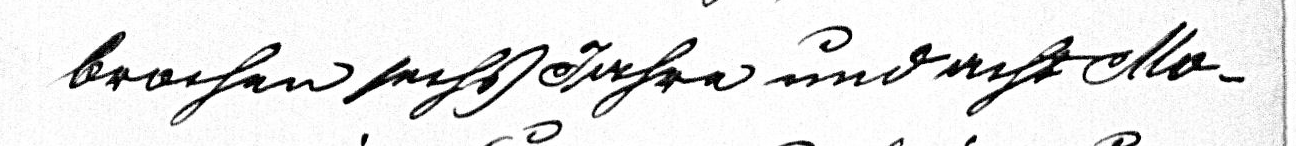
brochen sechs Jahre und acht Mo¬
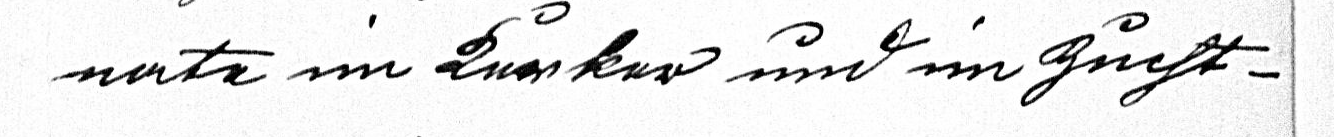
nate im Kerker und im Zucht¬
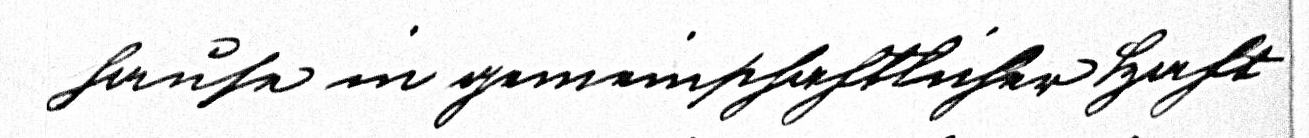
hause in gemeinschaftlicher Haft
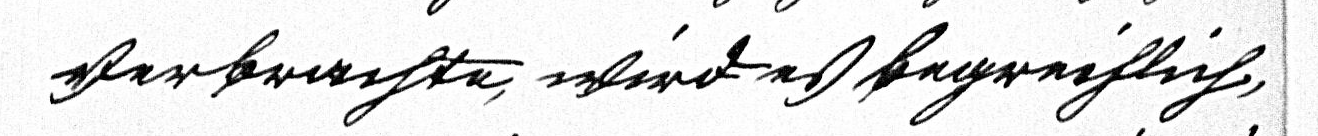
verbrachte, wird es begreiflich,
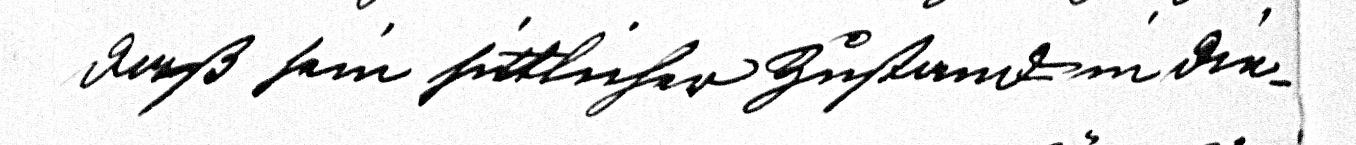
daß sein sittlicher Zustand in die¬
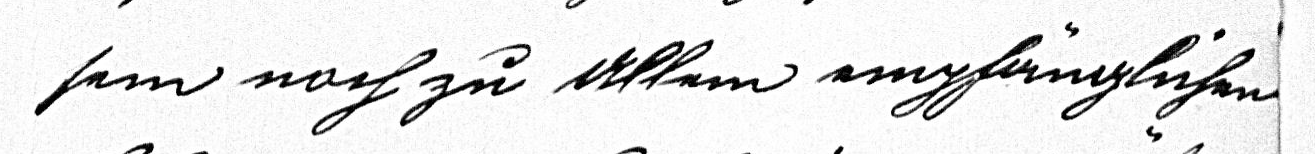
sem noch zu Allem empfänglichen
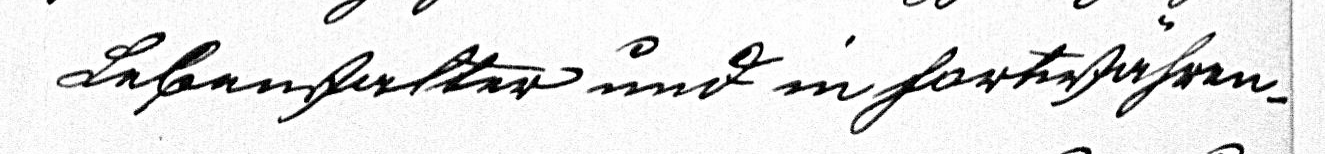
Lebensalter und in fortwähren¬
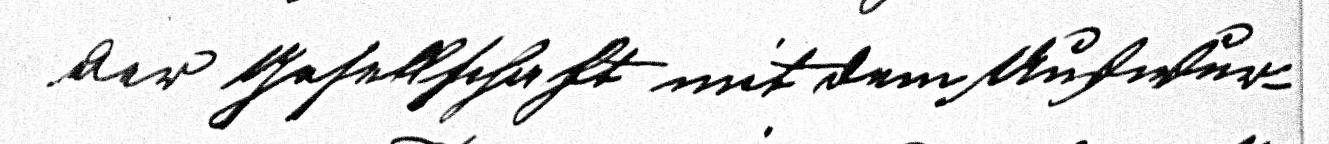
der Gesellschaft mit dem Auswur¬
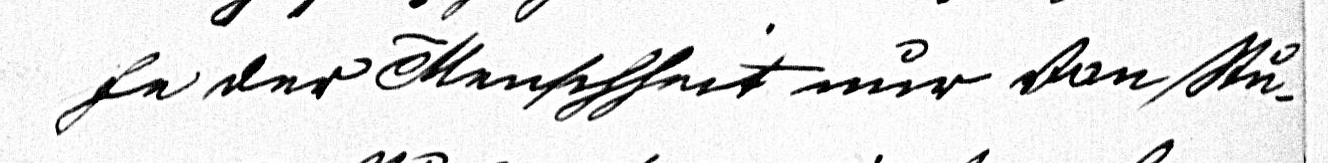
fe der Menschheit nur von Stu¬
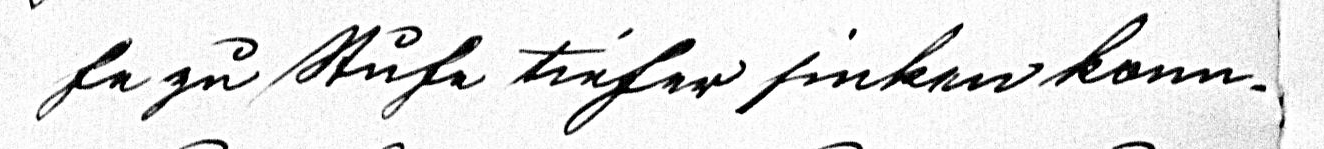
fe zu Stufe tiefer sinken konn¬
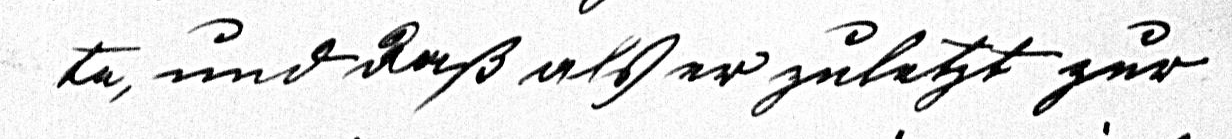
te, und daß als er zuletzt zur
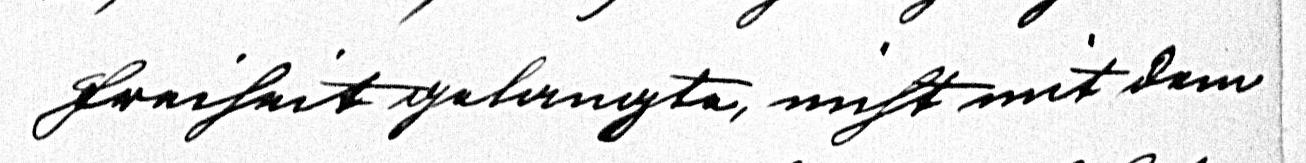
Freiheit gelangte, nicht mit dem
